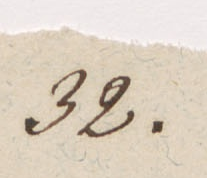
32.
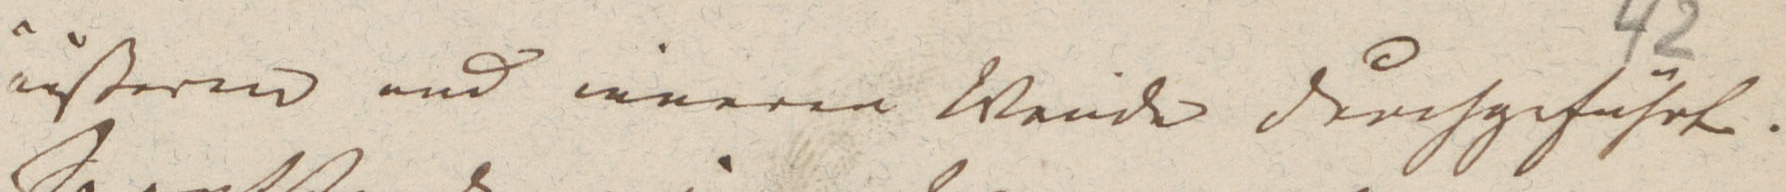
äusseren und inneren Wände durchgeführt.
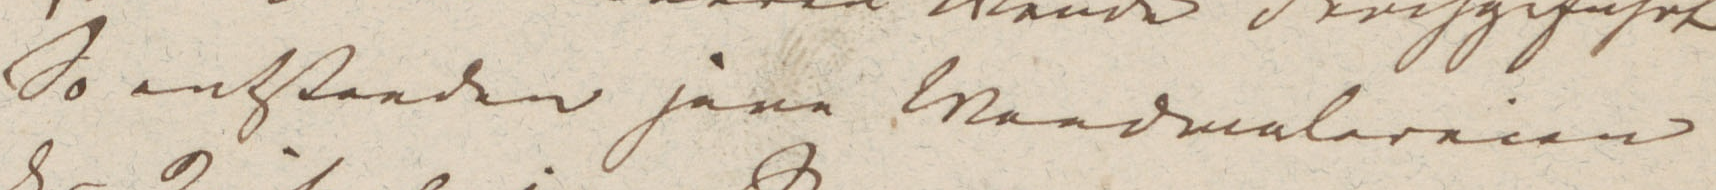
So entstanden jene Wandmalereien
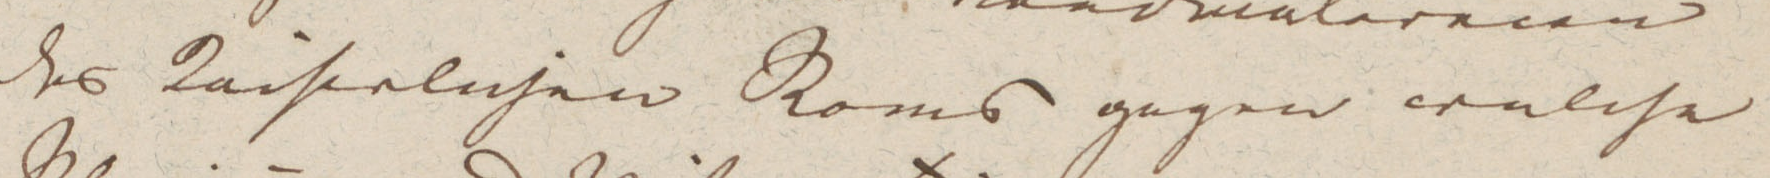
des Kaiserlichen Roms gegen welche
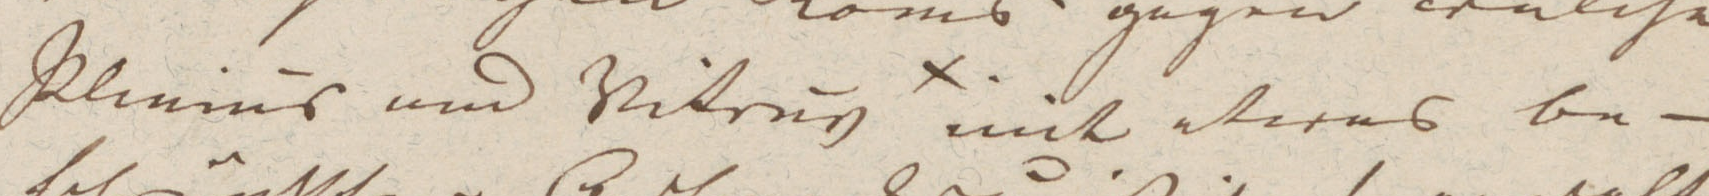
Plinius und Vitruv % mit etwas be-
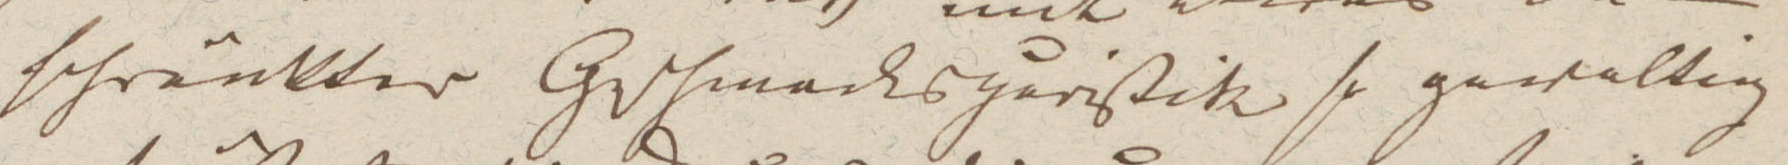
schränkter Geschmackspuristik so gewaltig
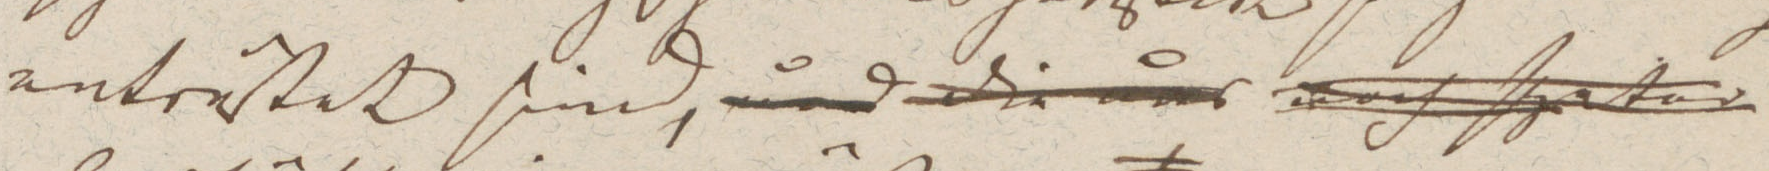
entrüstet sind, und die uns noch später
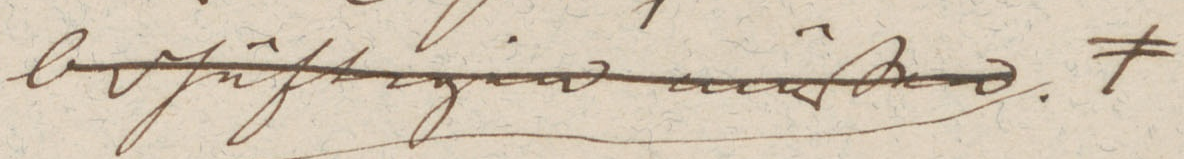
beschäftigen müssen. %%
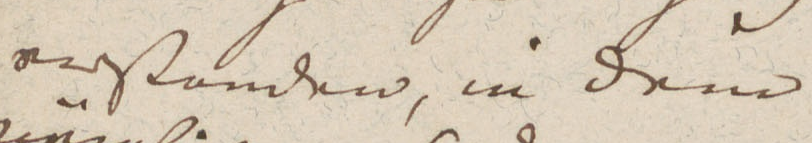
verstanden, in dem
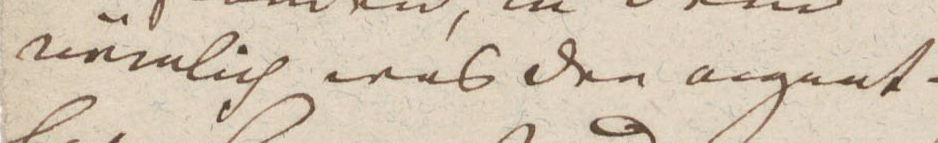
nämlich was den eigent-
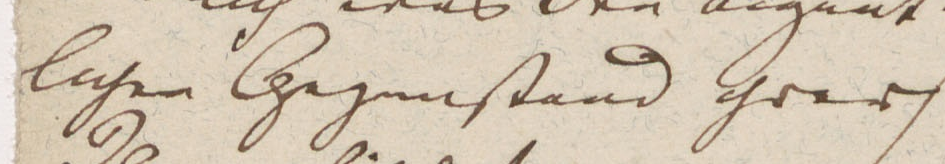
lichen Gegenstand ihrer
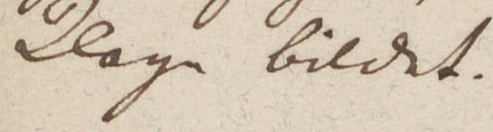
Klage bildet.
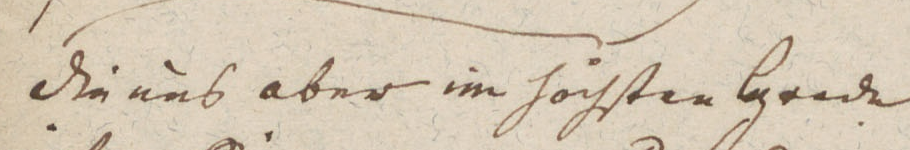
%% Die uns aber im höchsten Grade
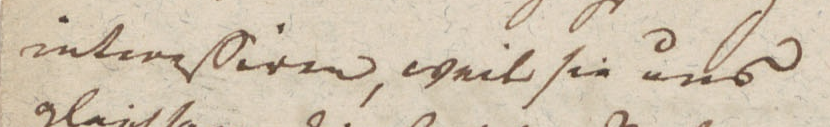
interessiren, weils sie uns
